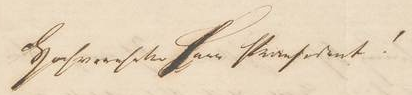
Hochverehrter Herr Praesident!
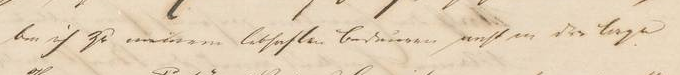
bin ich zu meinem lebhaften Bedauern nicht in der Lage
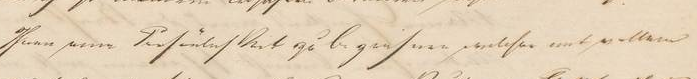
Ihnen eine Persönlichkeit zu bezeichnen welcher mit vollem
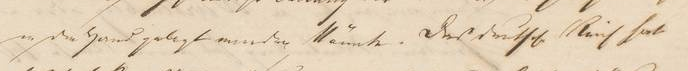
in die Hand gelegt werden könnte. Das deutsche Reich hat
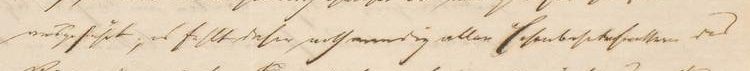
ausgeführt; es fehlt daher nothwendig allen Eisenbahntechnikern des
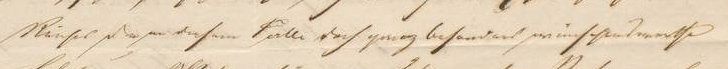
Reiches die in diesem Falle doch ganz besonders wünschenswerthe
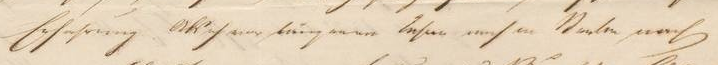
Erfahrung. Als ich vor längeren Jahren mich in Berlin nach
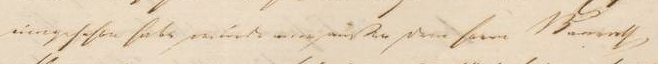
umgesehen habe wurde mir außer dem Herrn Baurath
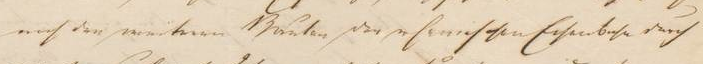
noch den weiteren Bauten der rheinischen Eisenbahn durch
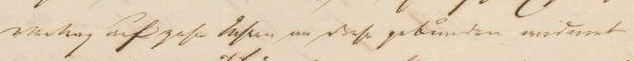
Vertrag auf zehn Jahren an diese gebunden widmet
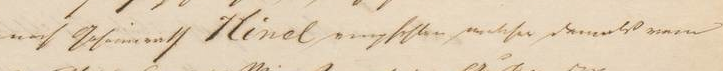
noch Geheimrath Kinel empfohlen welcher damals vom
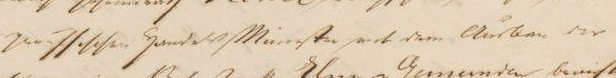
preussischen Handels Minister mit dem Ausbau der
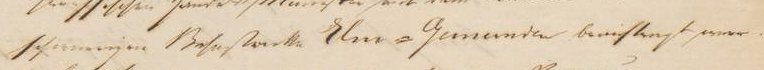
schwierigen Bahnstrecke Ulm–Gemünden beauftragt war.
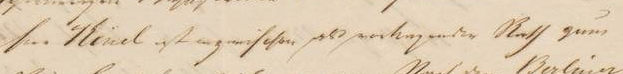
Herr Kinel ist inzwischen als vortragender Rath zum
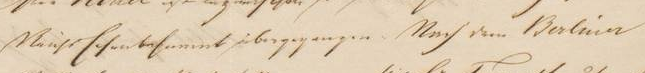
ReichsEisenbahnamt übergegangen. Nach dem Berliner
